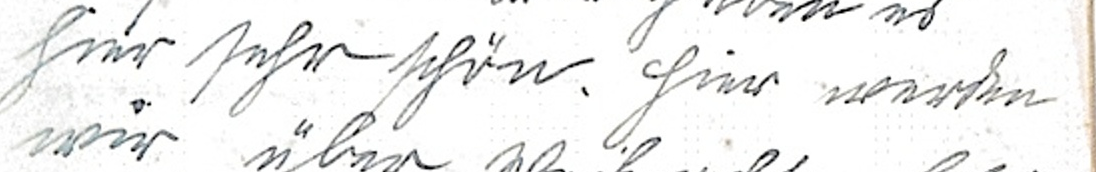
hier sehr schön. Hier werden
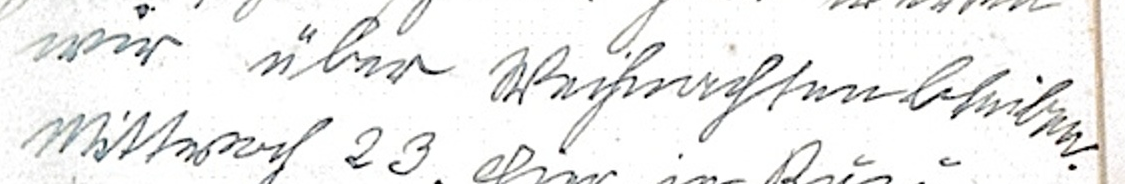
wir über Weihnachten bleiben,
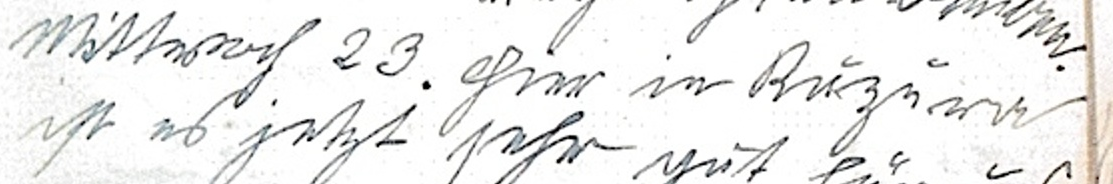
Mittwoch 23. Hier in Kuzmin
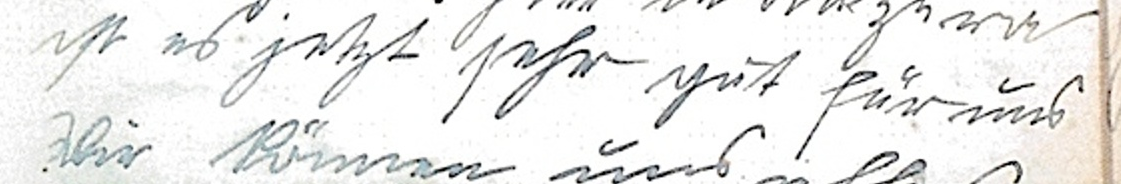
ist es jetzt sehr gut für uns
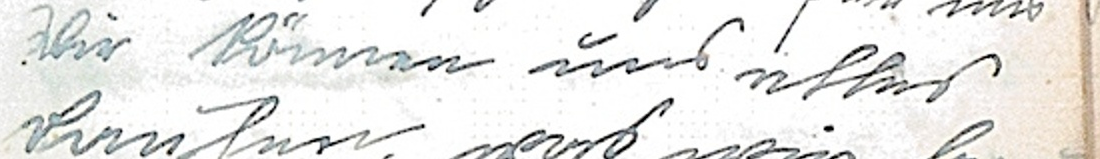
Wir können uns alles
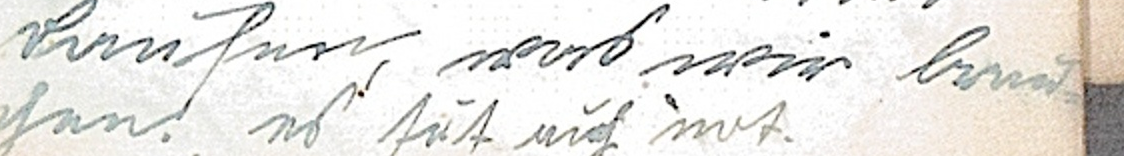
kaufen, was wir brau-
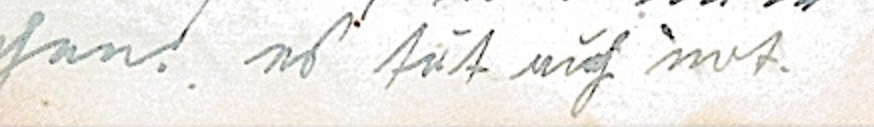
chen. Es tut auch not.
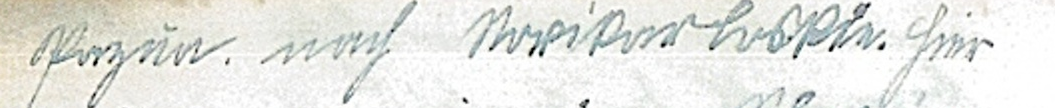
Stazin. Nach Nowikarlowski (Novi Karlovci). Hier
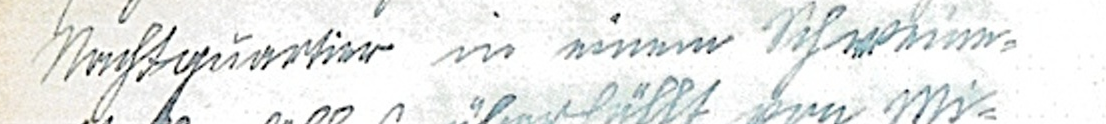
Nachtquartier in einem Schweine-
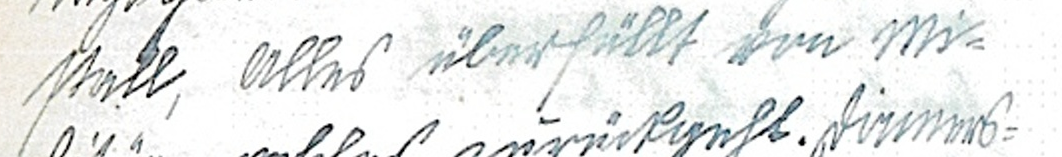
stall, alles überfüllt von Mi-
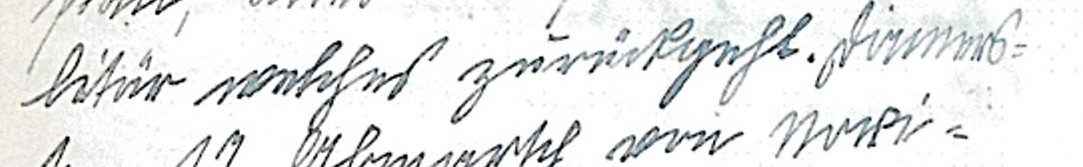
litär welches zurückgeht. Sams-
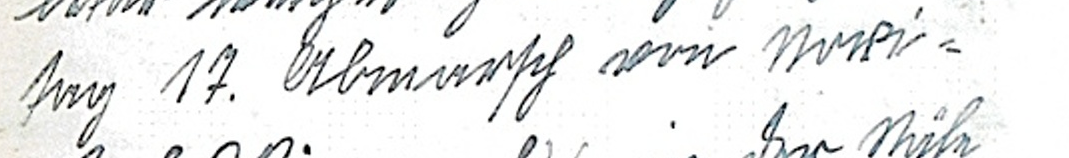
tag 17. Abmarsch von Nowi
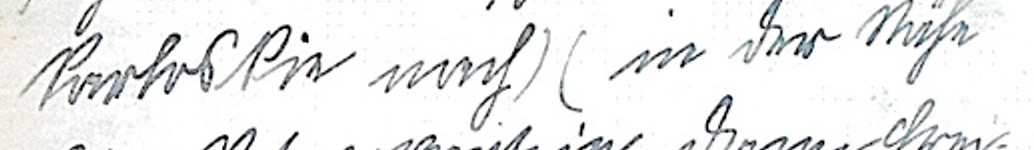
Karloskin nach () in der Nähe
